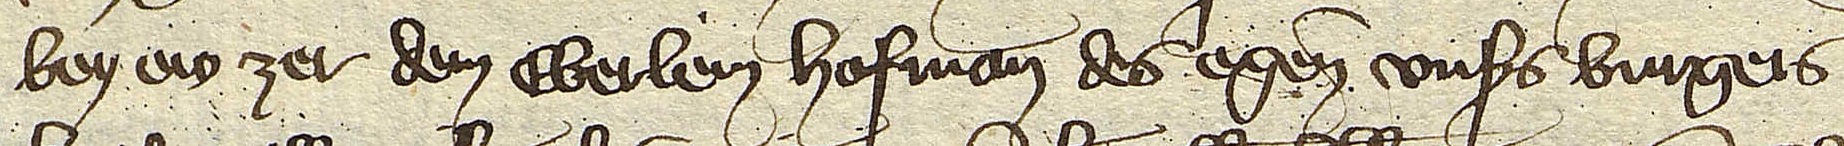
bey ew cʒer dem Eberlein hofman des egen* vnſ*s burgers
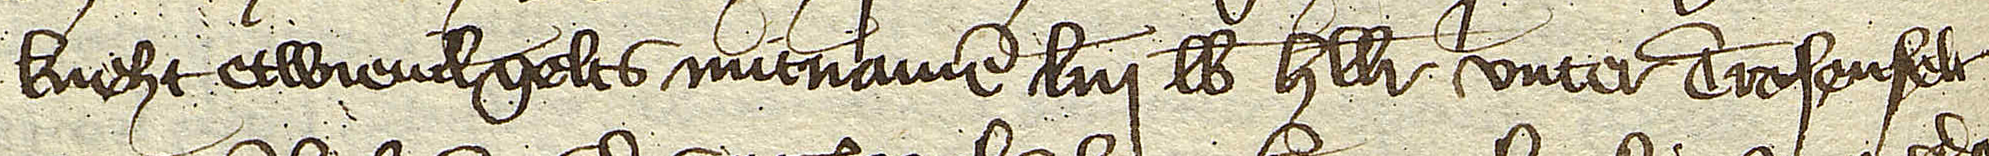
kneht etwieuil gelts mitname* liii* lb* hllr* vnter Troſenfelt
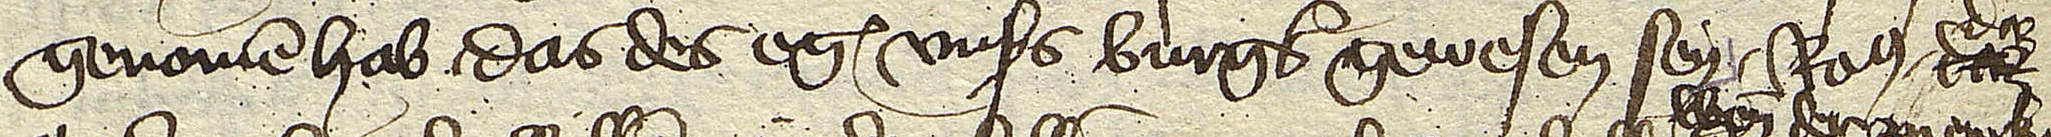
genome* hab / das des eg* vnſ*s burgs* geweſen ſein / Ro* / daʒ
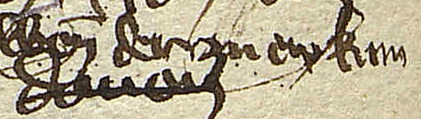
wen* der cʒu ew kum
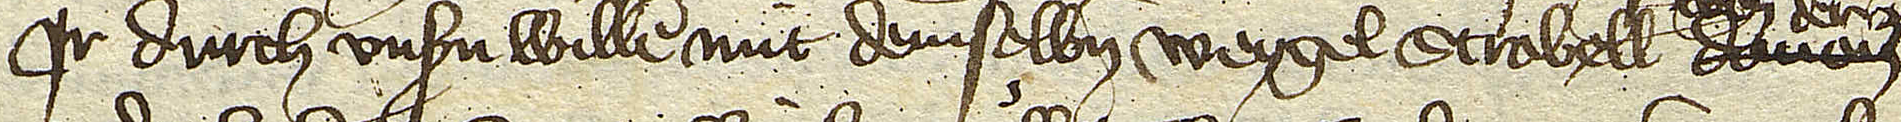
Ir durch vnſ*n wille* mit demſelbn* weygel Strobell dauon
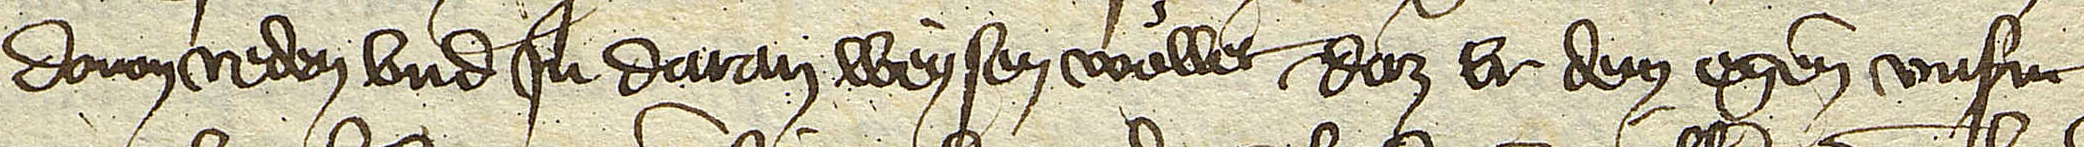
dauon reden vnd In daran weyſen wöllet / daʒ Er dem egen* vnſ*m
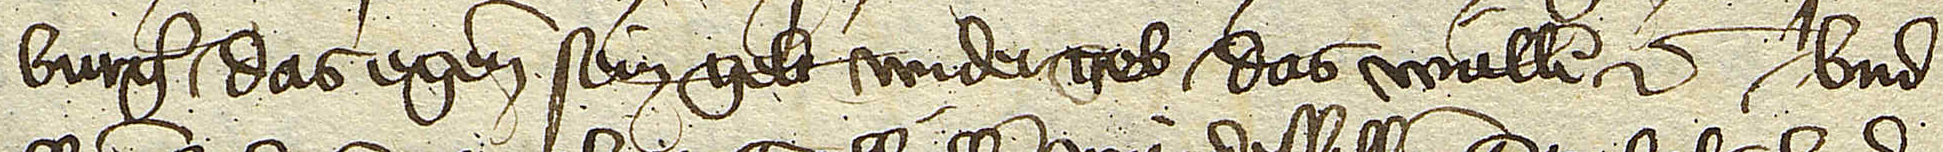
burg* / das egen* ſein gelt widergeb / das wölle* ec* / vnd
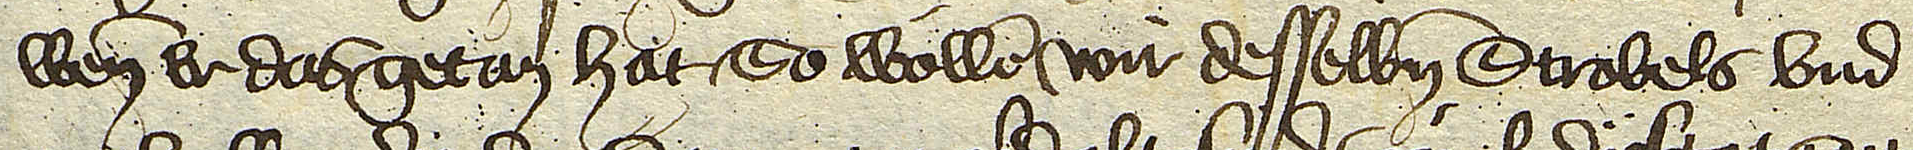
wen* Er das getan hat / So wölle* wir deſſelbn* Strobels vnd
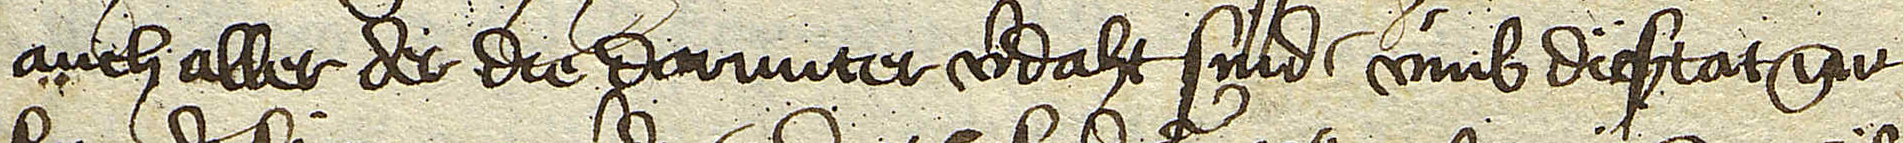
auch aller der die darunter v*daht ſind / v̈mb dieſ* tat gut
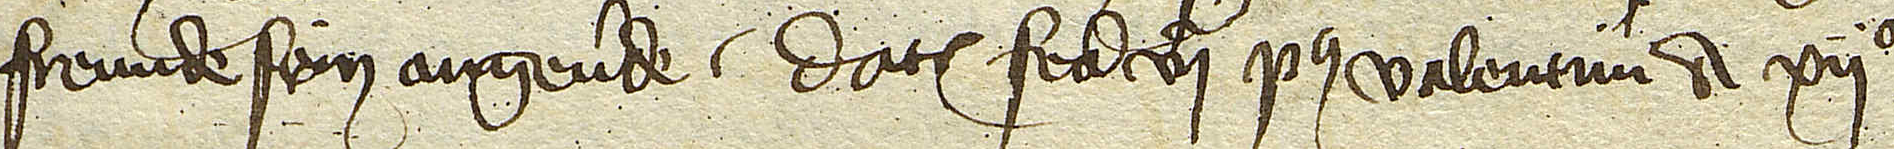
freunde ſein ongeu*de / dat* fea* vi* p* valentini A xii*
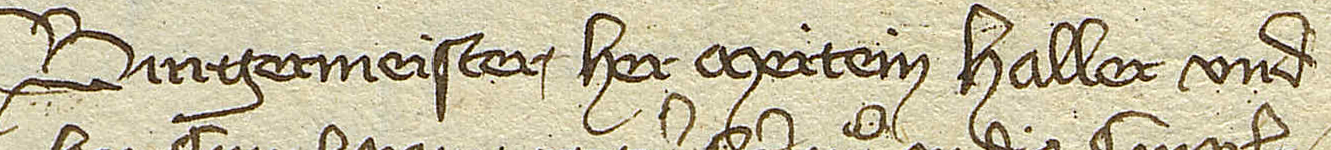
Burgermeiſter her Mertein Haller vnd
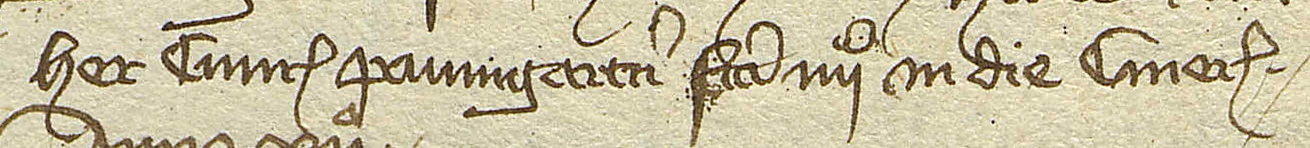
her Cunr* paumgartn* fia* iiii* in die Ciner* . /
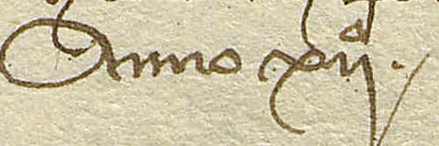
Anno xii* . /
